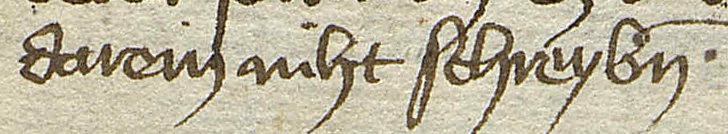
darein niht ſchreyb*n
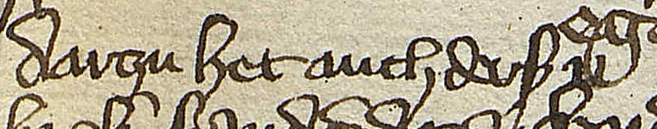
darcʒu het auch derſ*
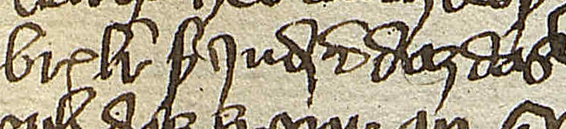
br* lr* ſ* Iud* ec* daʒ das
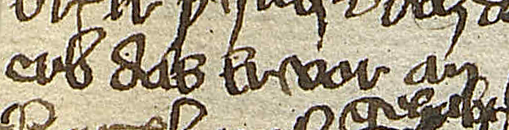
erb das Er vor an
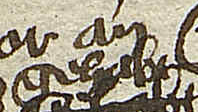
gehabt
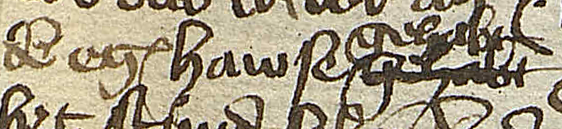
de* eg* hawſe gehabt
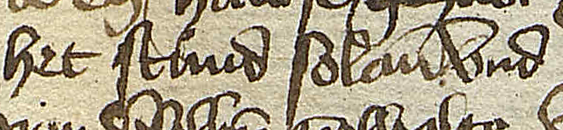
het ſtünd ſolan* vnd
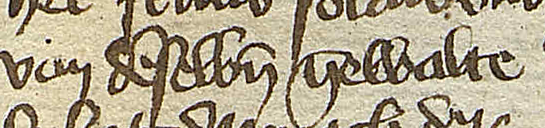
von de*ſelb*n gewalte
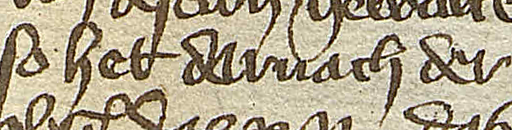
ſo het darnach der
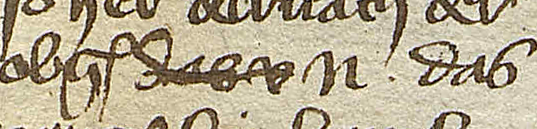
obg* das v N . das
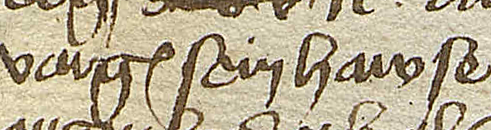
vorg* ſein hawſe
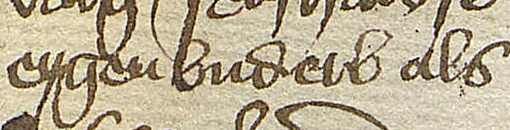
eygen vnd erb als
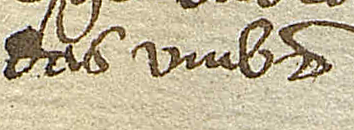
das vmb ec*
